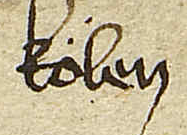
Kölen
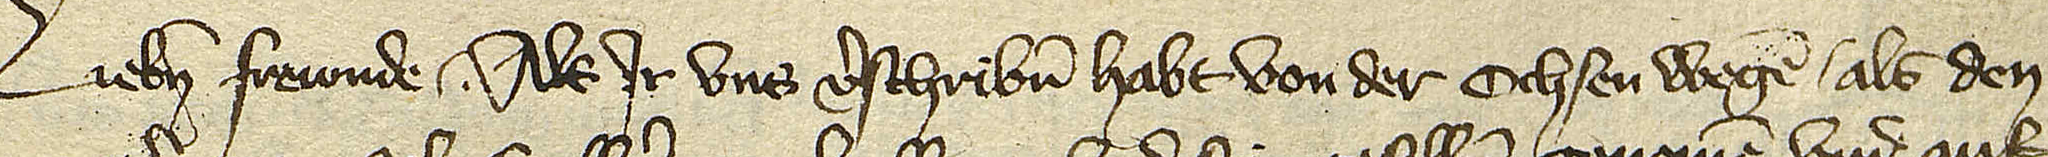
Liebn* frewnde / . Als Ir vns v*ſchribn* habt von der Ochſen wege* / als den
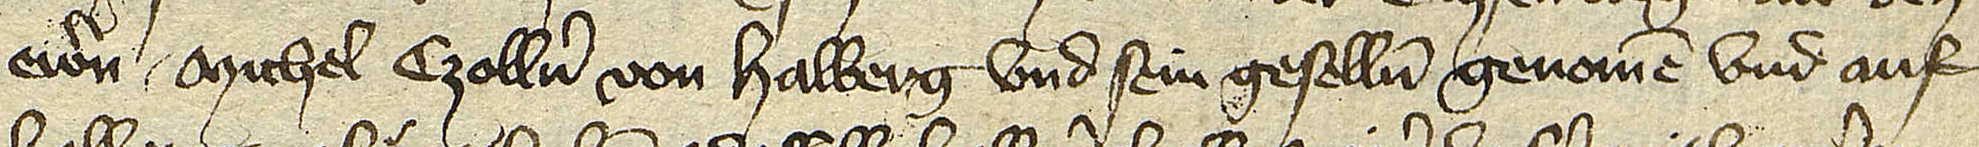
ewn* / Michel Cʒolln* von halberg vnd ſein geſelln* genome* vnd auf
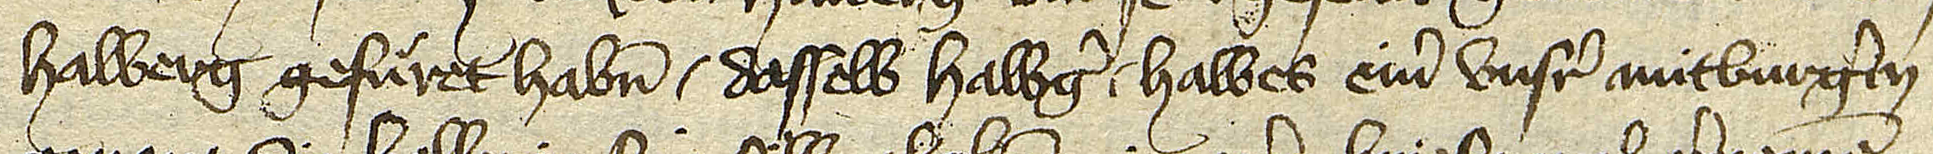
halberg gefüret habn* / daſſelb halbg* / halbes ein* vnſr* mitburg*in
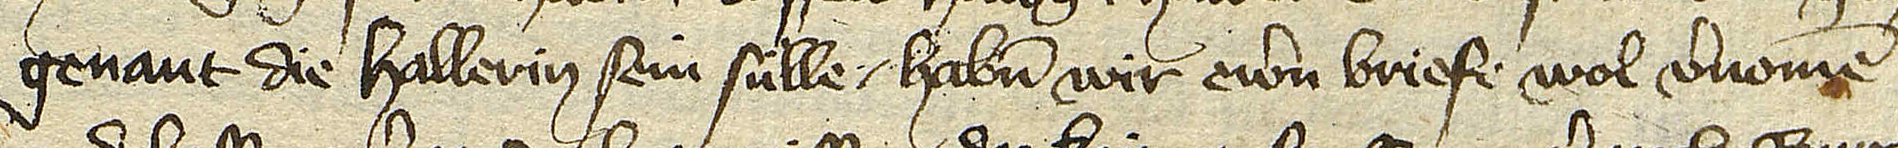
genant die hallerin ſein ſülle / habn* wir ewn* briefe wol v*nome*
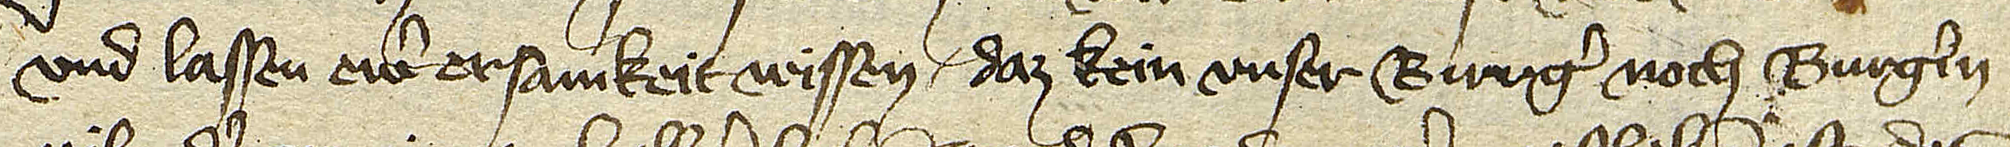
vnd laſſen ew* erſamkeit wiſſen / daʒ kein vnſer Burg* noch Burg*in
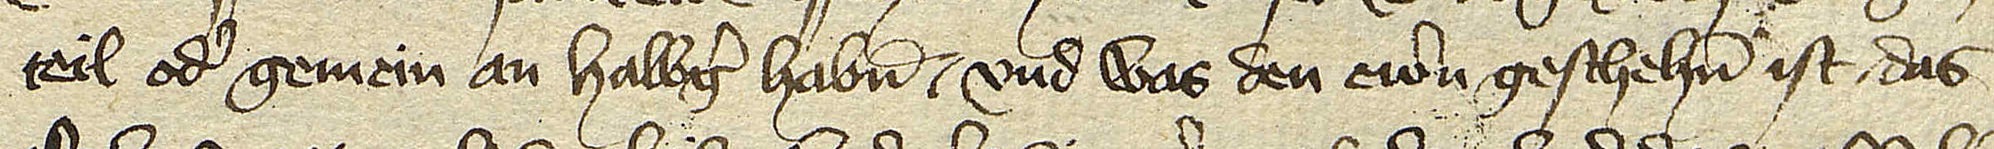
teil od* gemein an halbg* habn* / vnd was den ewn* geſchehn* iſt / das
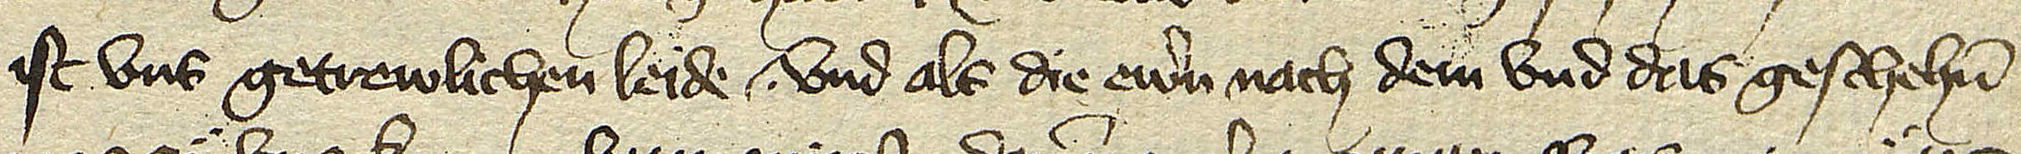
iſt vns getrewlichen leide / . vnd als die ewn* nach dem vnd das geſchehn*
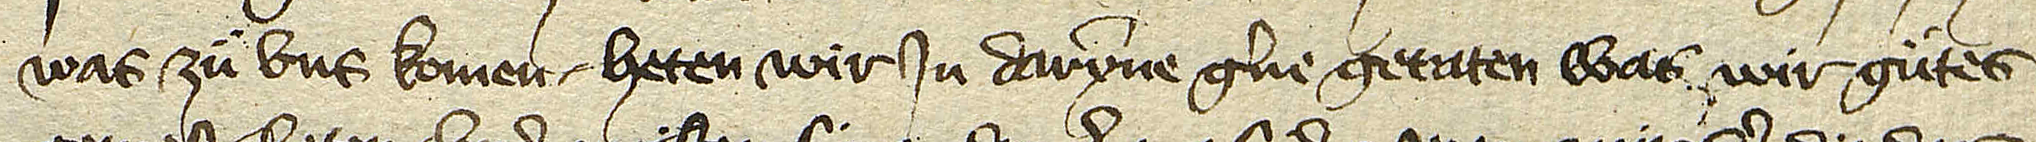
was cʒü vns komen / heten wir In daryne* g*ne getaten was wir gütes
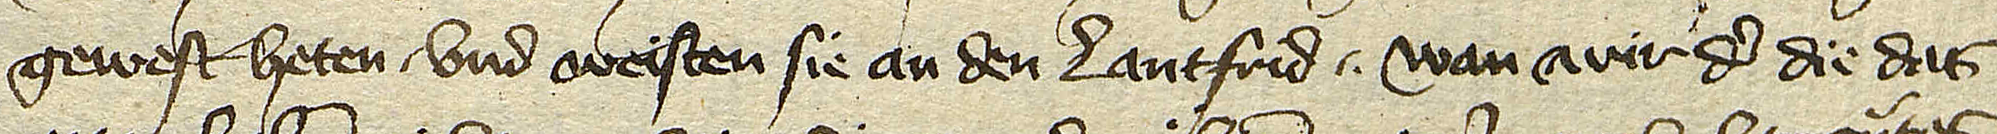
geweſt heten / vnd weiſten ſie an den Lantfrid / . wan wir d* die das
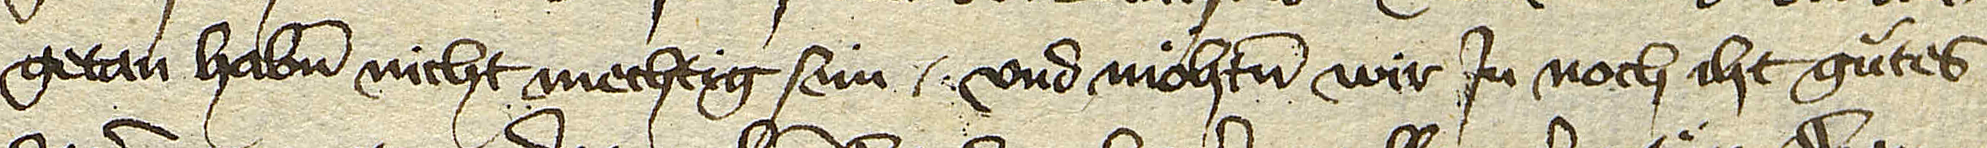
getan habn* nicht mechtig ſein / vnd möhtn* wir In noch iht gütes
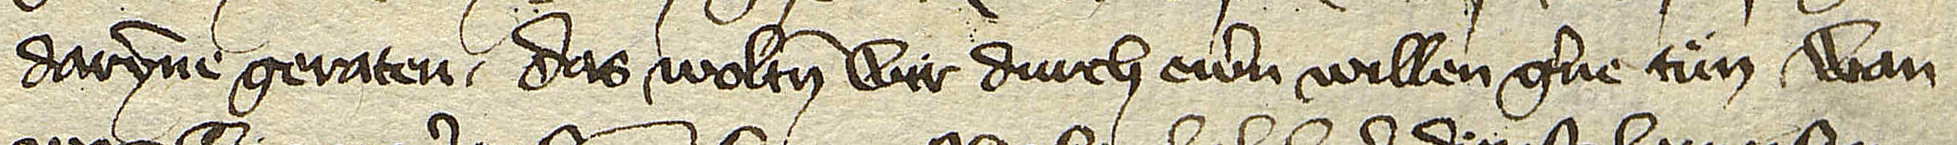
daryne* geraten / Das woltn* wir durch ewn* willen g*ne tün / wan
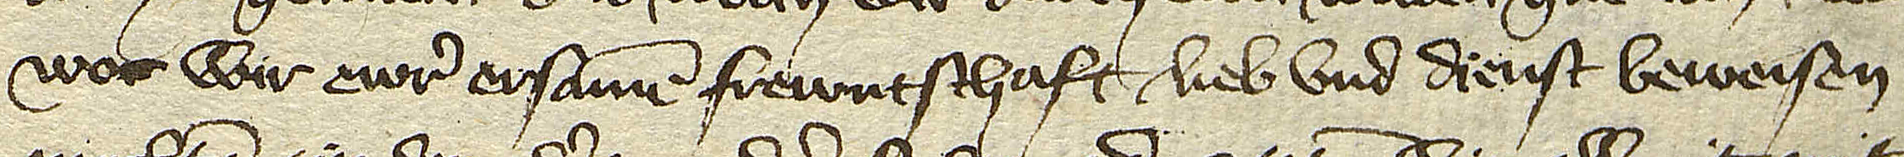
wor wir ewr* erſame* frewntſchaft / lieb vnd dienſt beweiſen
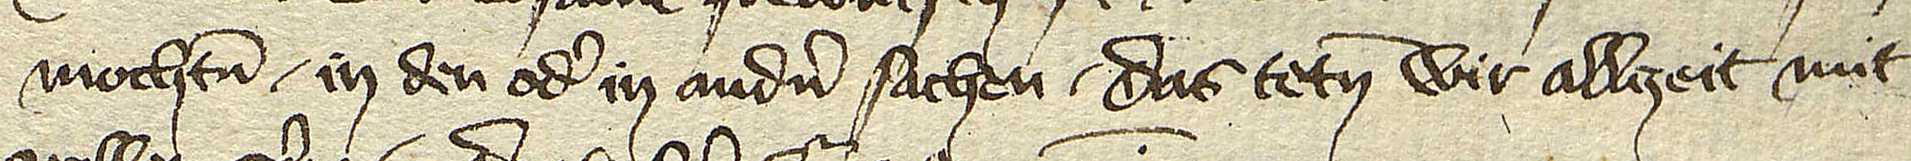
mochtn* / in den od* in andn* ſachen / Das tetn wir allcʒeit mit
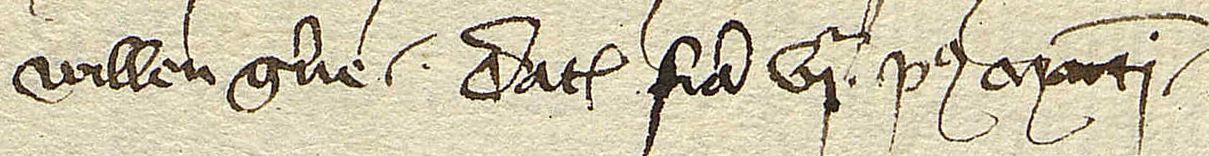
willen g*ne / . Dat* fia* vi* p* Marti* / .
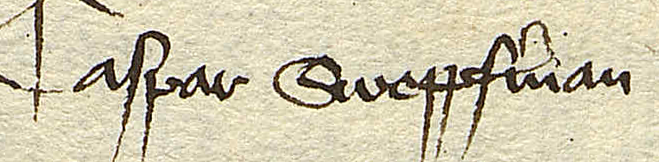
Caſpar Sweppf*man
